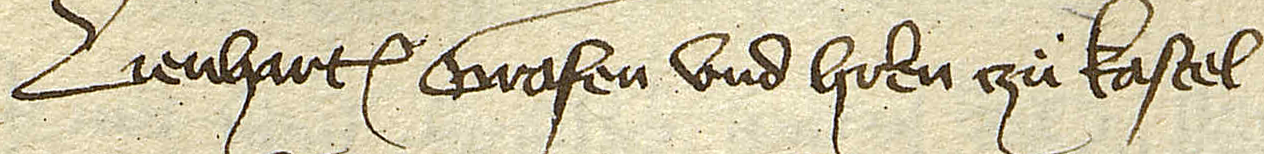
Lienhart* Grafen vnd hr*en cʒü Kaſtel
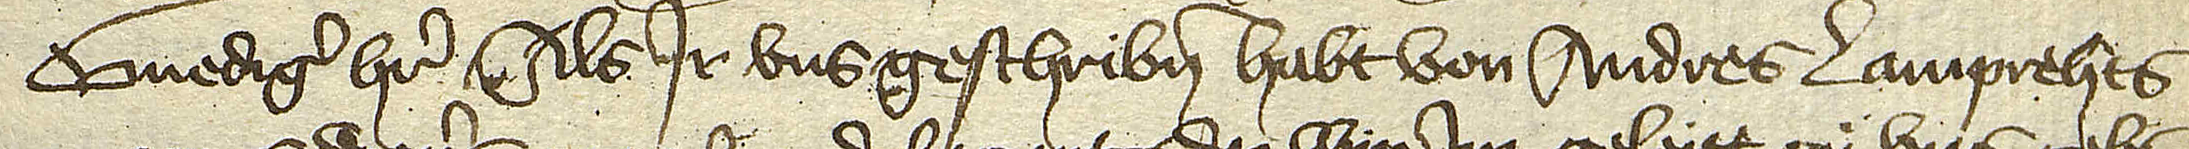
Gnedig* hr* / Als Ir vns geſchribn* habt von Andres Lamprechts
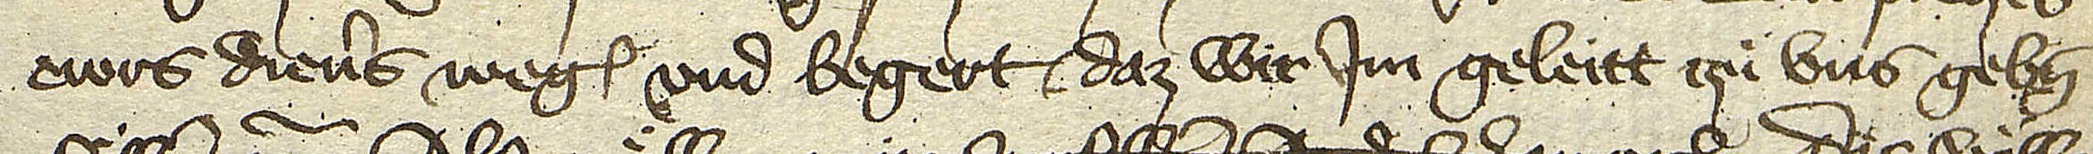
ewrs dien*s weg* vnd begert / daʒ wir Im geleitt cʒü vns gebn*
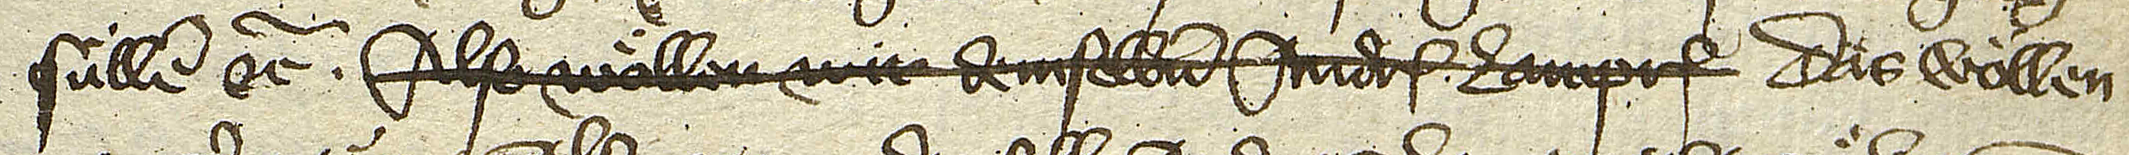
ſülle* ec*. Alſo wöllen wir demſelbn* Andr* Lampr* Das wöllen
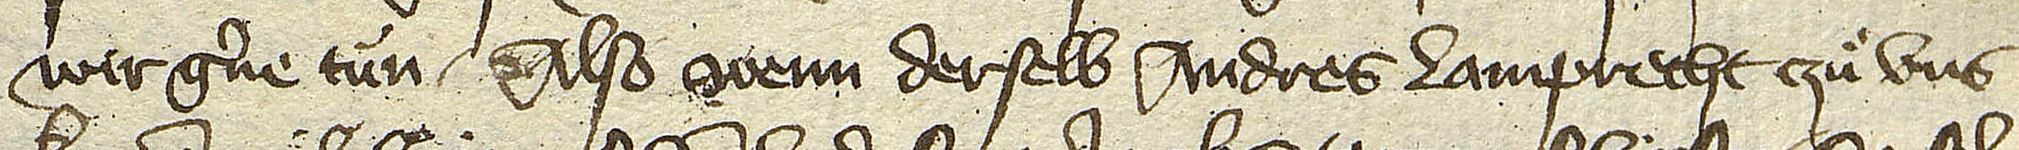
wir g*ne tun / Alſo wenn derſelb Andres Lamprecht cʒü vns
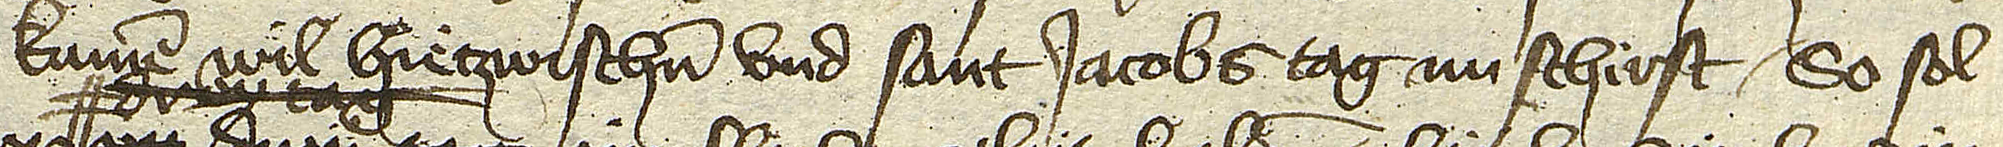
kume* wil hiecʒwiſchn* vnd ſant Iacobs tag nu ſchirſt / So ſol
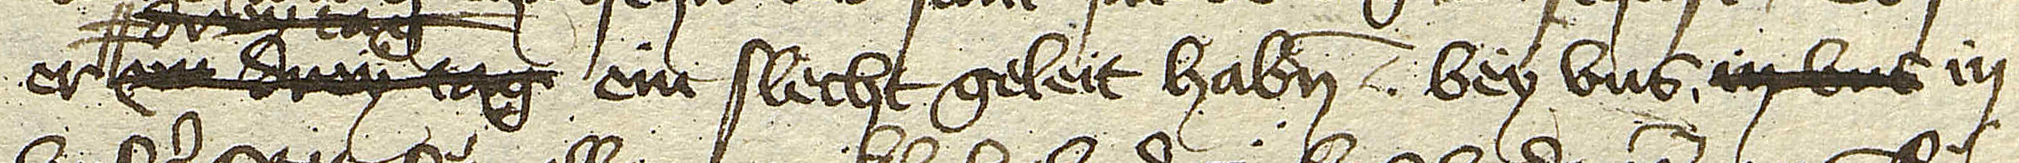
er vn drey tag ein ſlecht geleit habn* / . bey vns in vns in
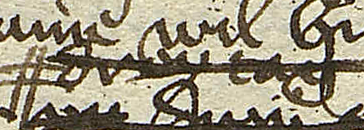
drey tag
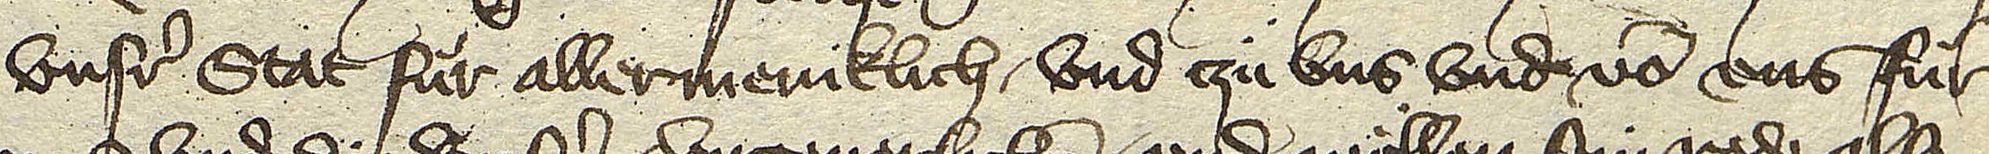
vnſ*r Stat für allermeniklich / vnd cʒü vns vnd vo* vns für
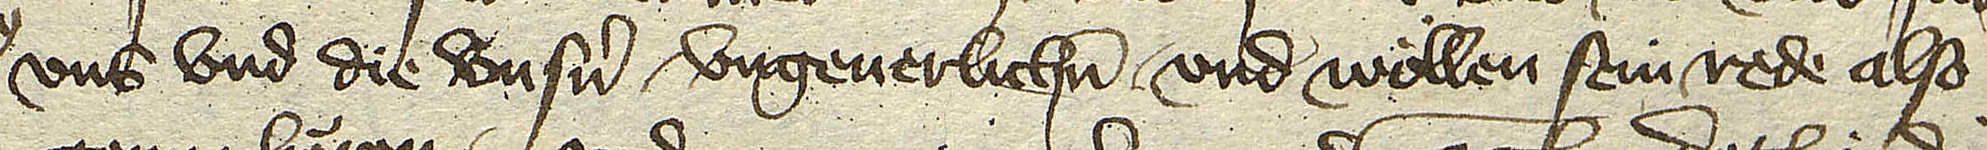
vns vnd die vnſn* / vngeuerlichn* / vnd wölllen ſein rede alſo
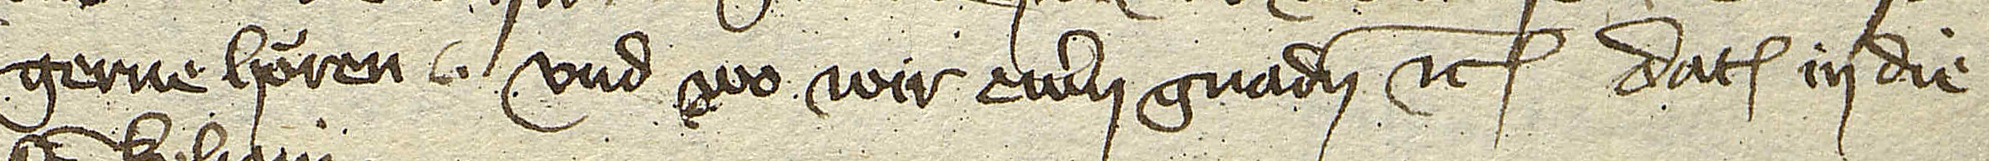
gerne hören / . vnd wo wir ew*n gnadn* ec* Dat* in die
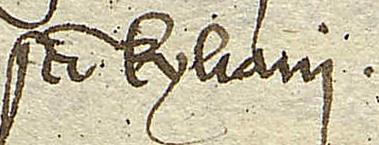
ſci* kyliani .
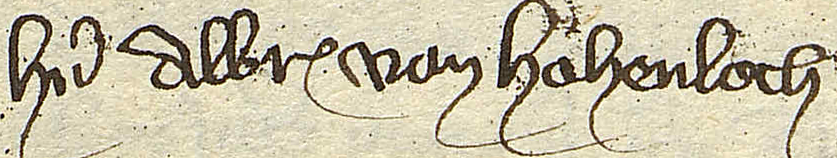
hn* Albr* von Hohenloch
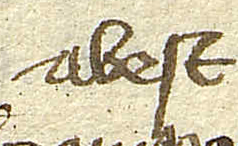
abeſt
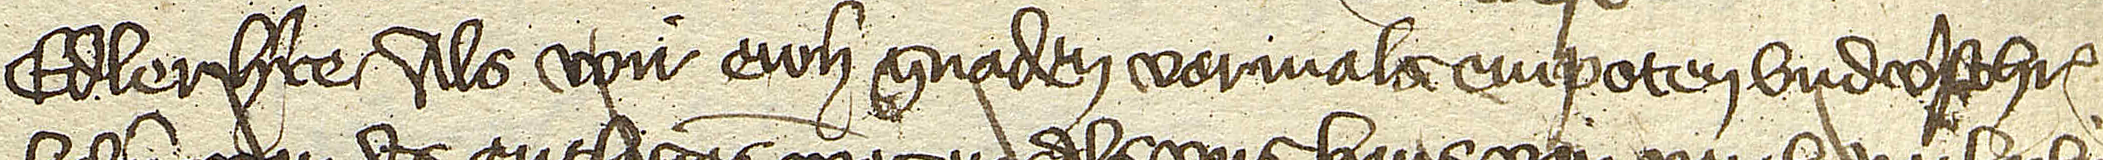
Edler h*re / Als wir ewn* gnaden vormals empoten vnd v*ſchr*
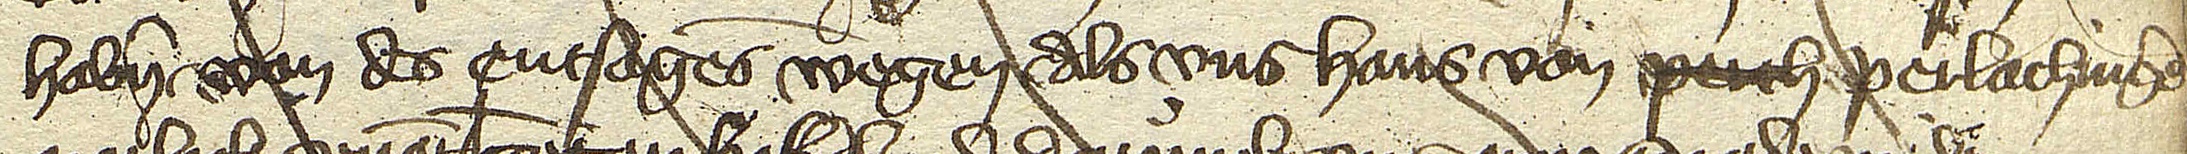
habn* / von des entſages wegen / als vns hans von perch perlachinge*
